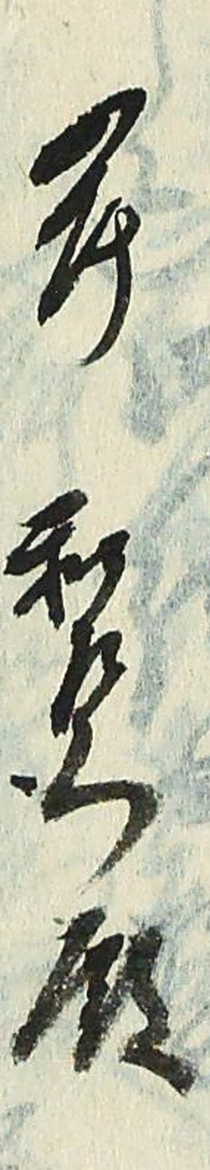岸和左衛門殿
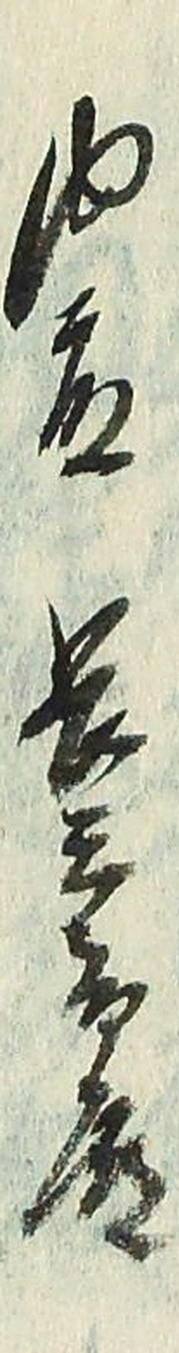内藤長三郎殿
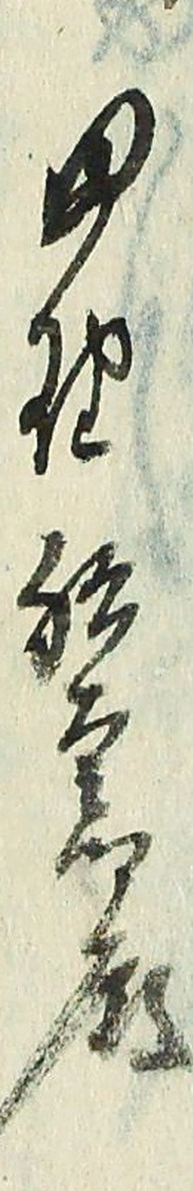田野祐太郎殿
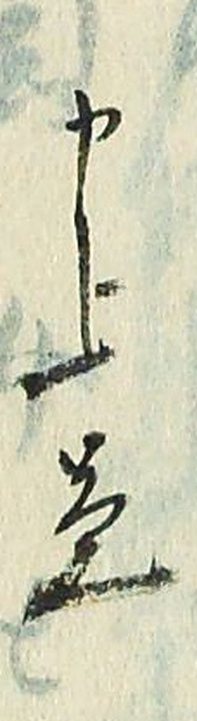申上覚
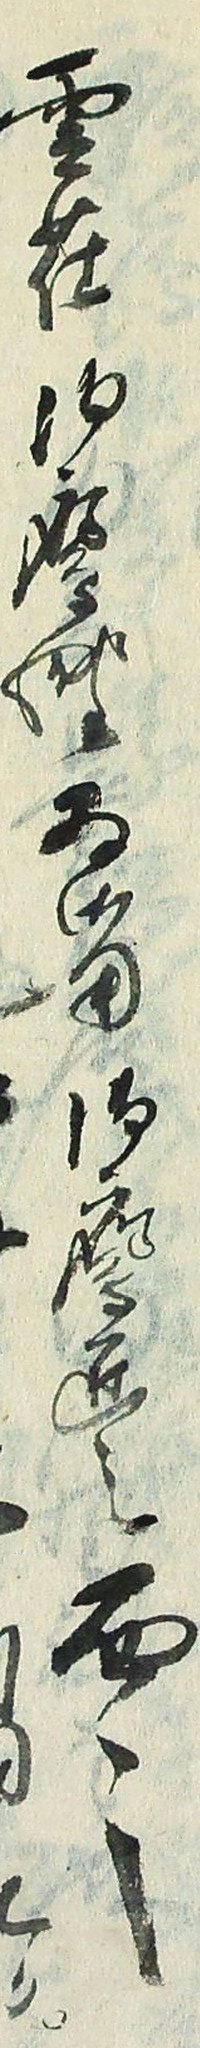雲雀御鷹野為御用と御鷹匠之面々
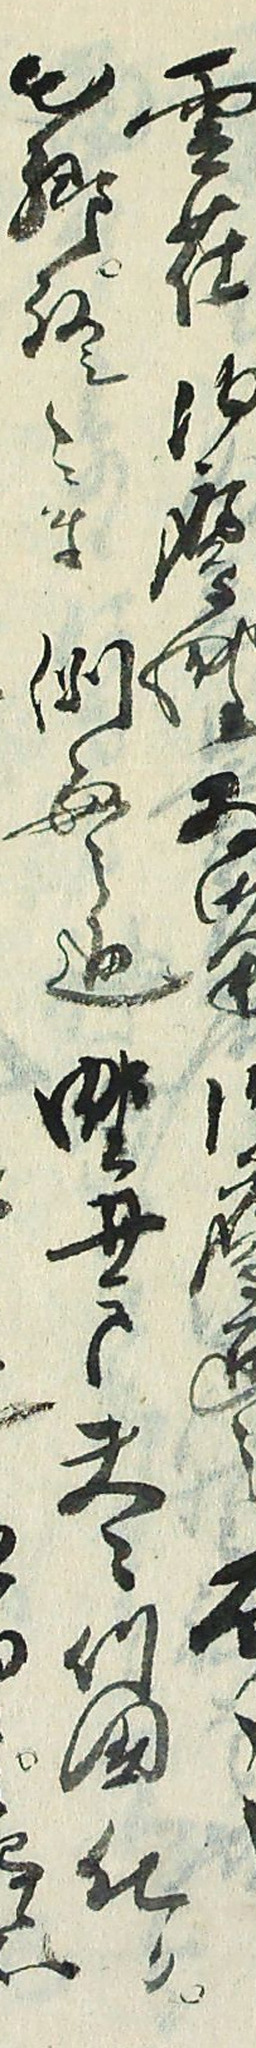出郷致し候に付例毎之通野井戸夫々竹囲仕り
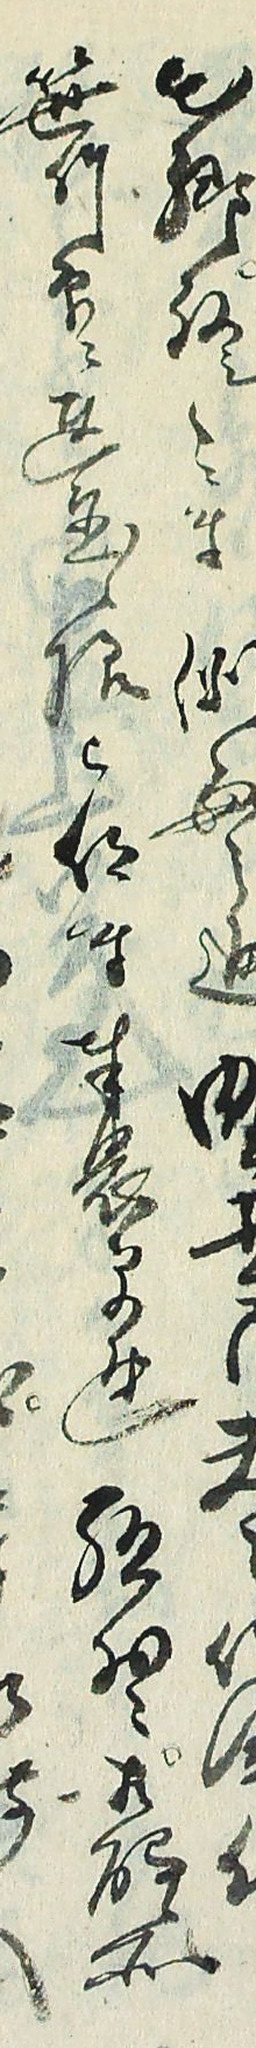笹竹印に建置候様被仰付奉畏早速組村々相触候所
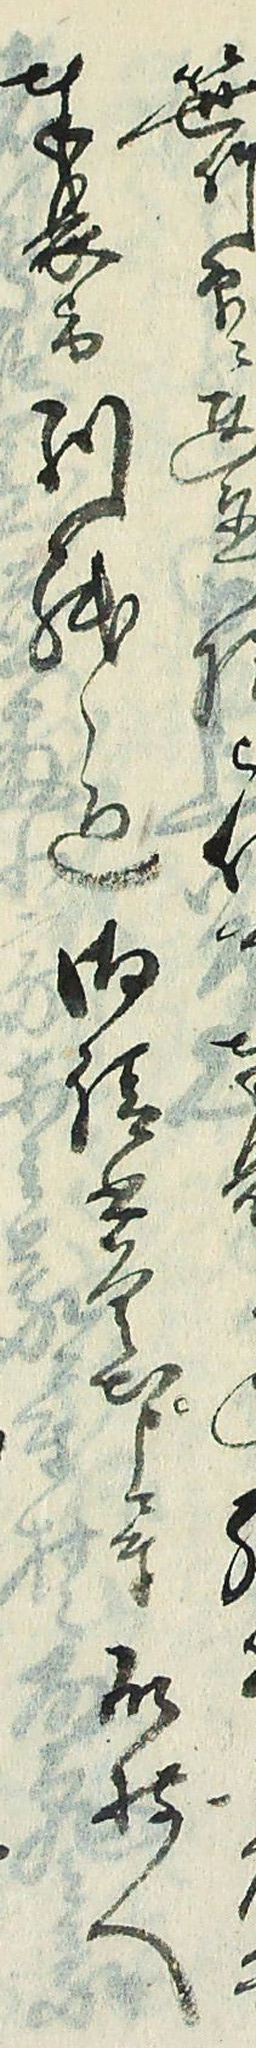奉畏旨別紙之通御請書差出申に付取揃へ
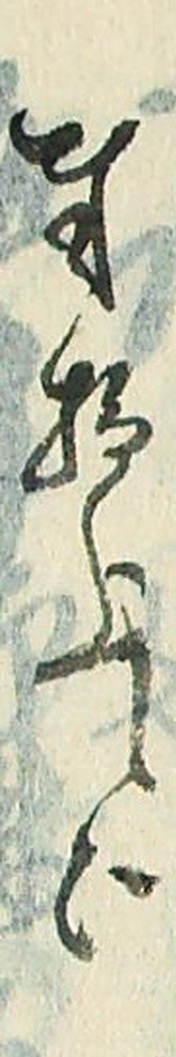奉指上候以上
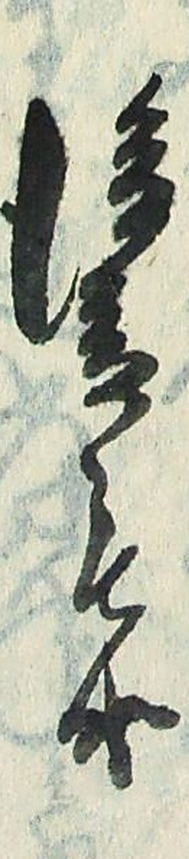後藤庄助
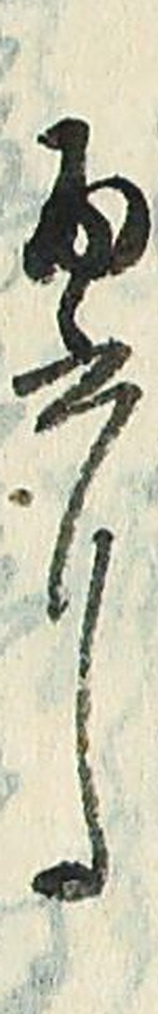酉六月
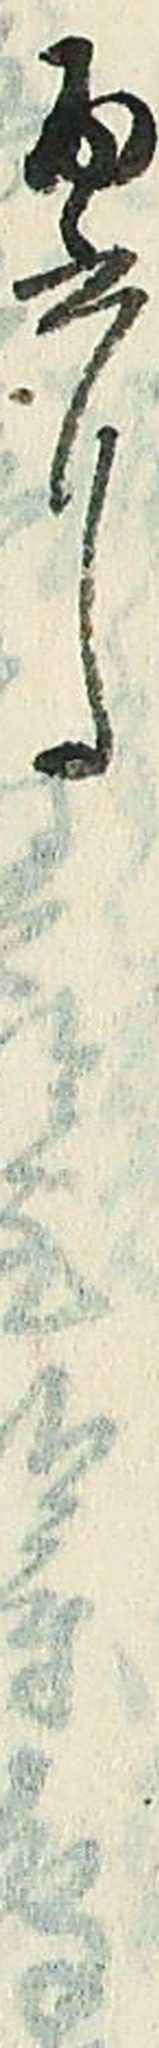酉六月
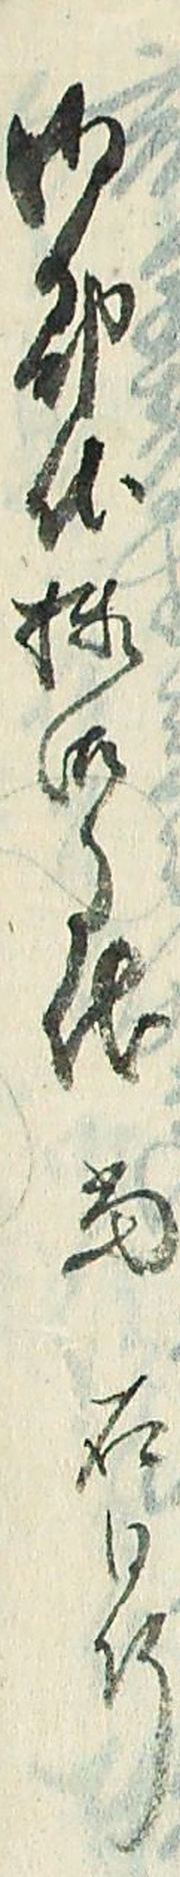御郡代様御手代当右同断
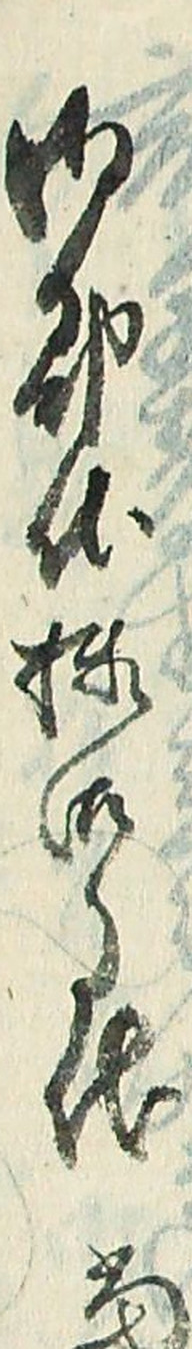御郡代様御手代

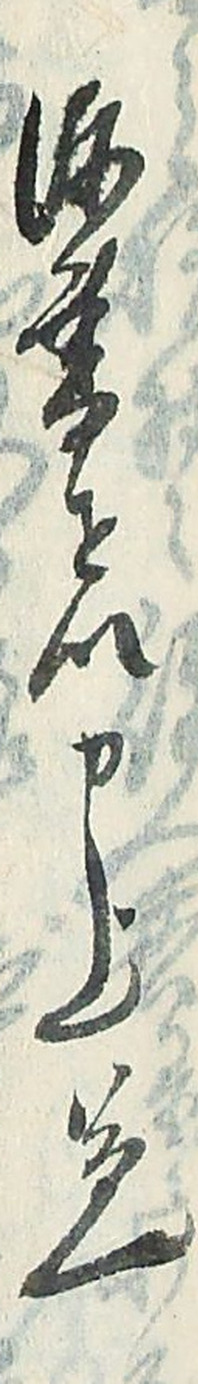添書を以申上覚
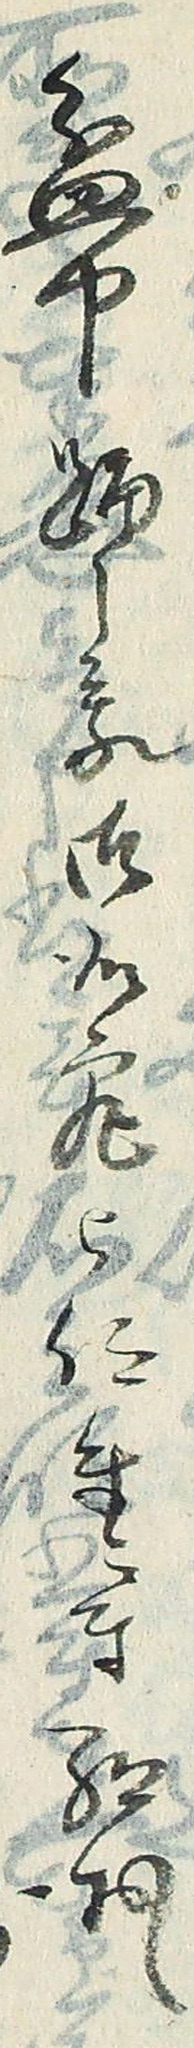盆中踊之義御取究被仰付候に付組村へ
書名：諸御用御□受書控
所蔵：鳴門教育大学 Naruto University of Education
